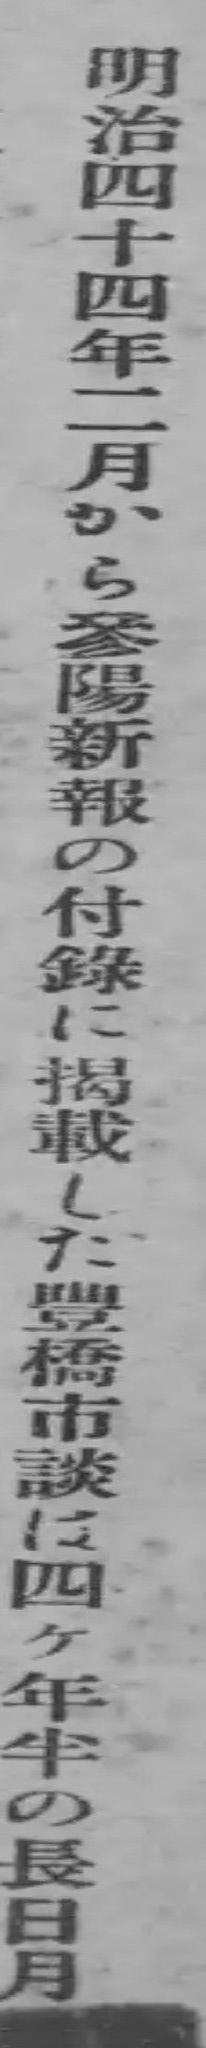明治四十四年二月から参陽新報の付録に掲載した豊橋市談は四ケ年半の長年月
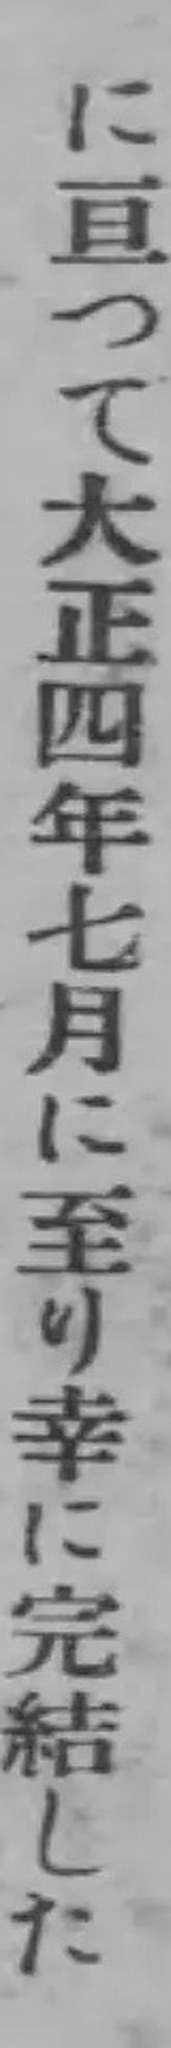に亘つて大正四年七月に至り幸に完結した
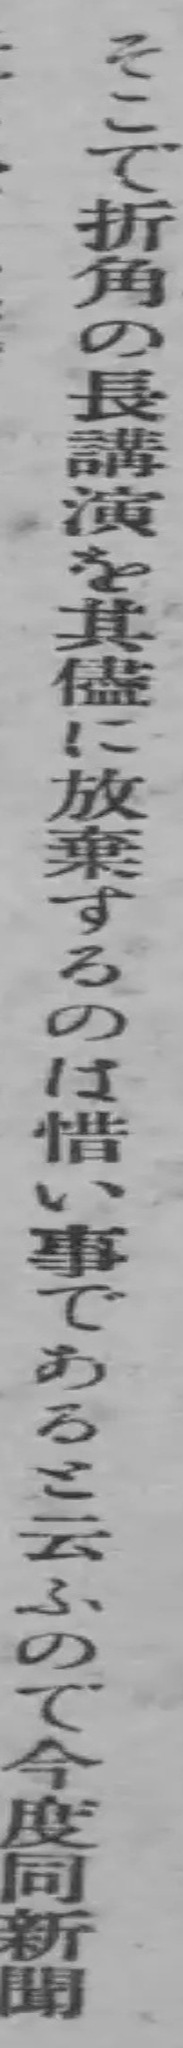そこで折角の長講演を其儘に放棄するのは惜い事であると云ふので今度同新聞
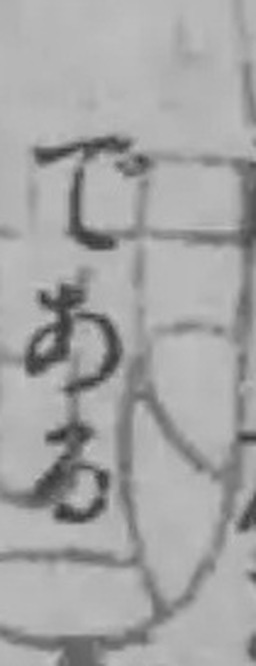である
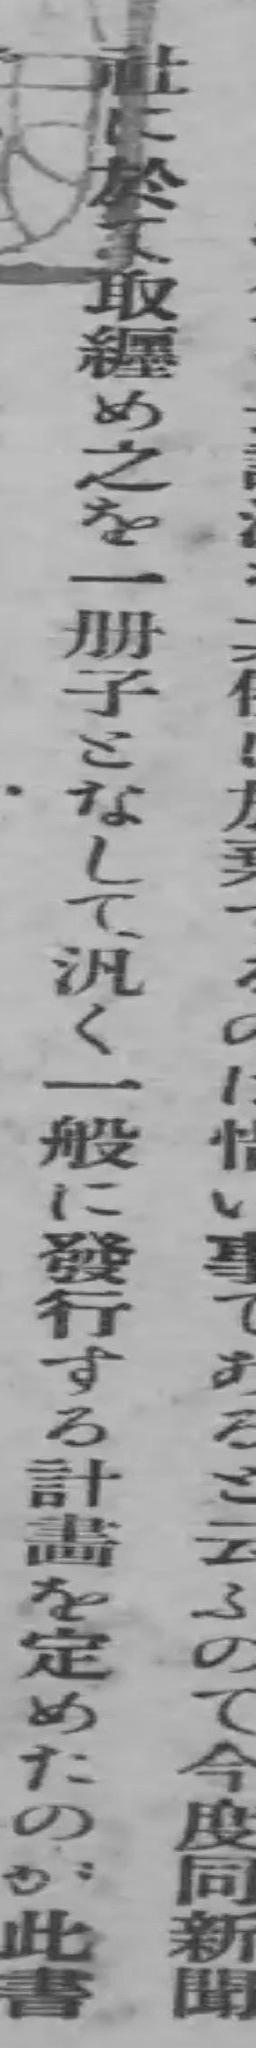社に於て取纏め之を一冊子となして汎く一般に発行する計画を定めたのが此書
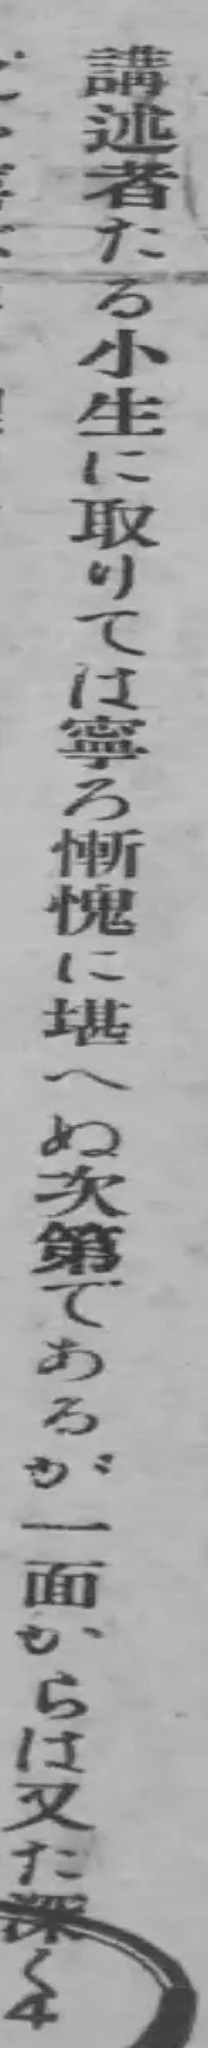講述者たる小生に取りては寧ろ慚愧に堪へぬ次第であるが一面からは又た深く
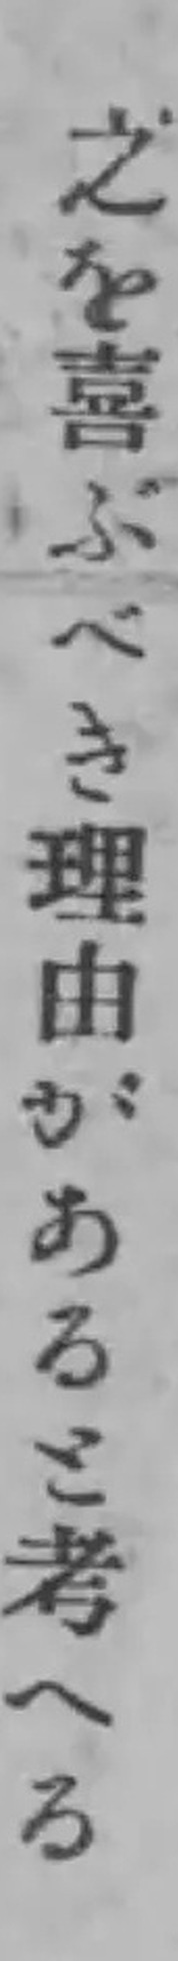之を喜ぶべき理由があると考へる
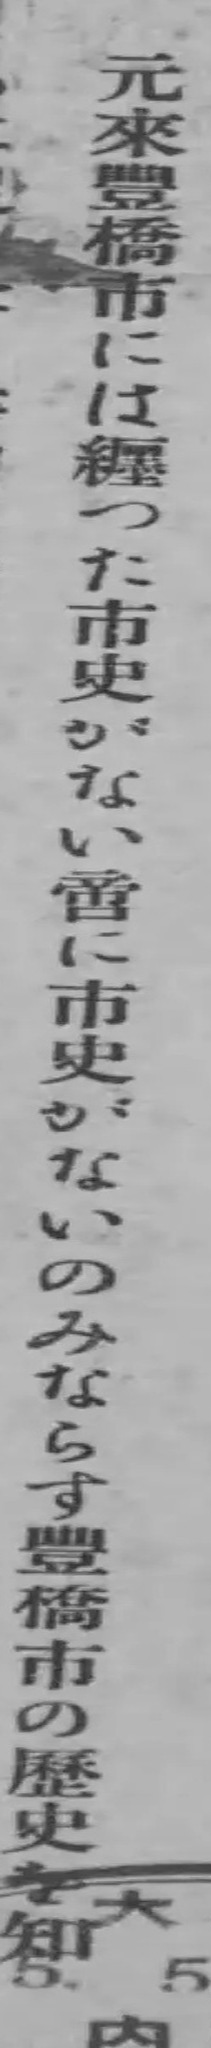元来豊橋市には纏つた市史がない啻に市史がないのみならす豊橋市の歴史を知
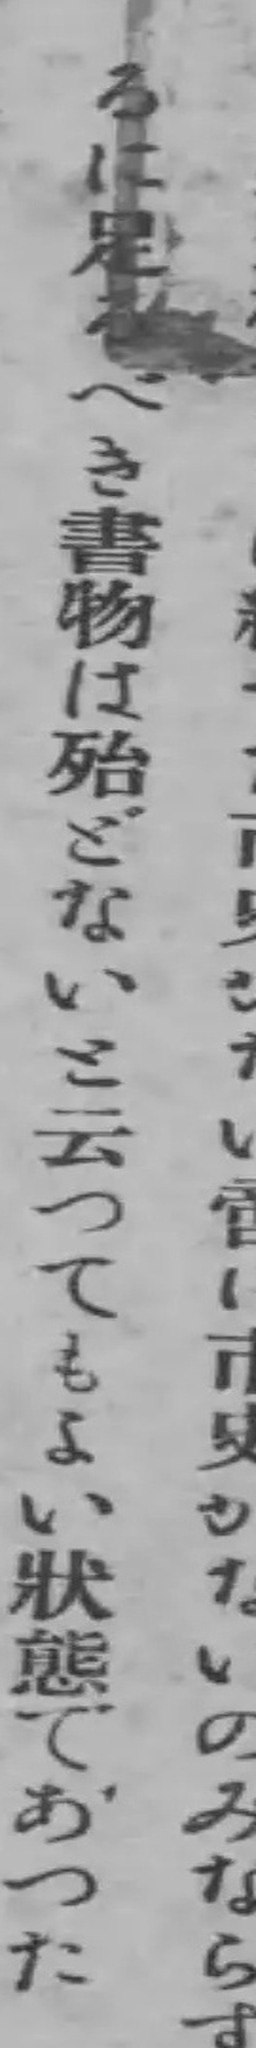るに足るべき書物は殆どないと云つてもよい状態であつた
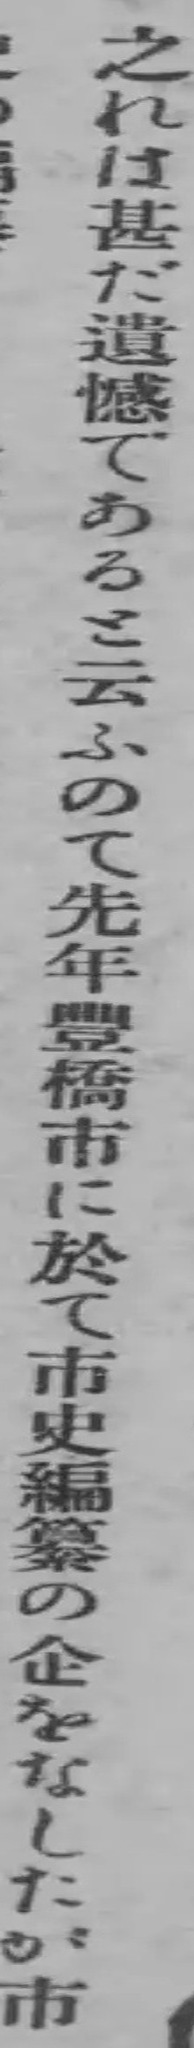之れは甚だ遺憾であると云ふのて先年豊橋市に於て市史編纂の企をなしたが市
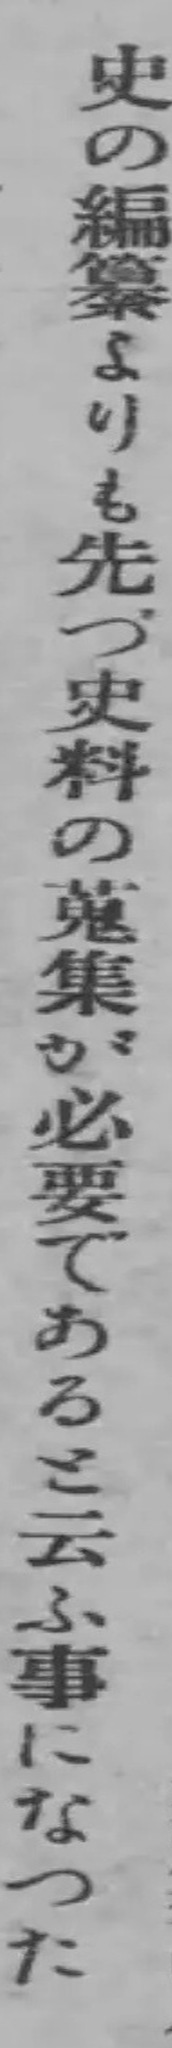史の編纂よりも先づ史料の蒐集が必要であると云ふ事になつた
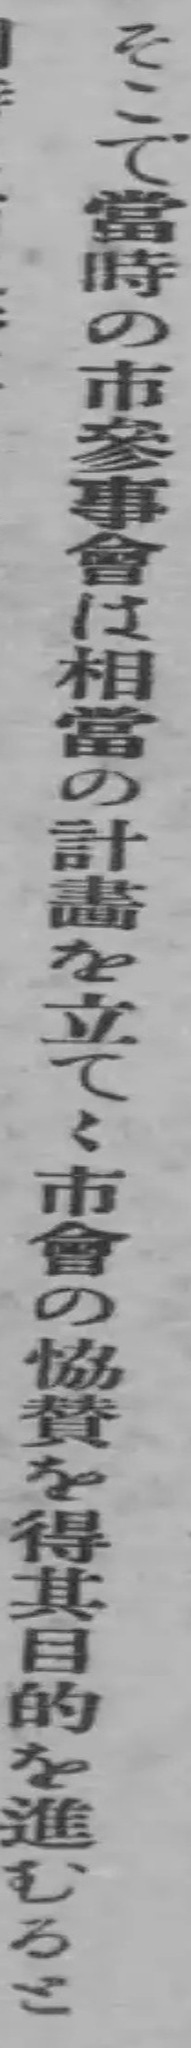そこで当時の市参事会は相当の計画を立てゝ市会の協賛を得其目的を進むると
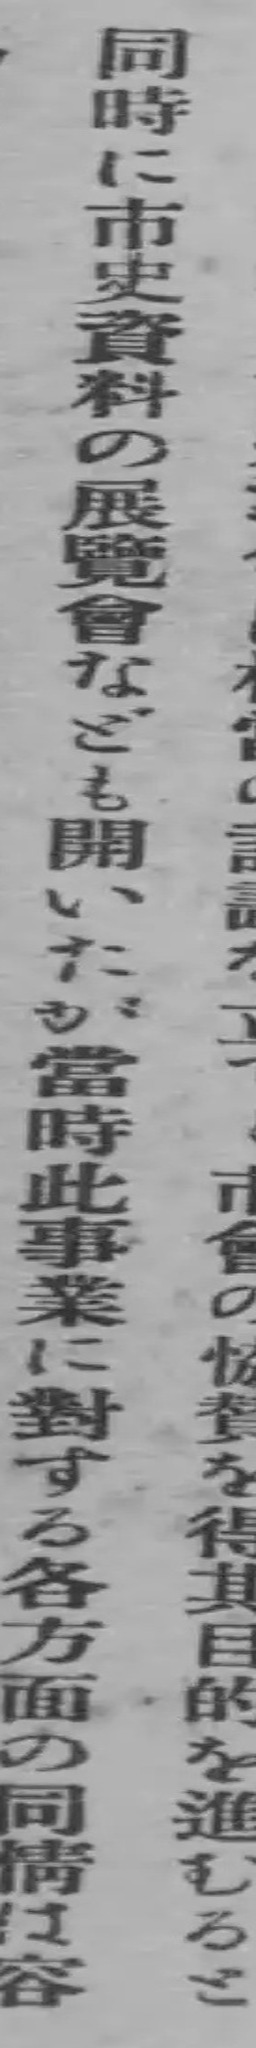同時に市史資料の展覧会なども開いたが当時此事業に対する各方面の同情は容
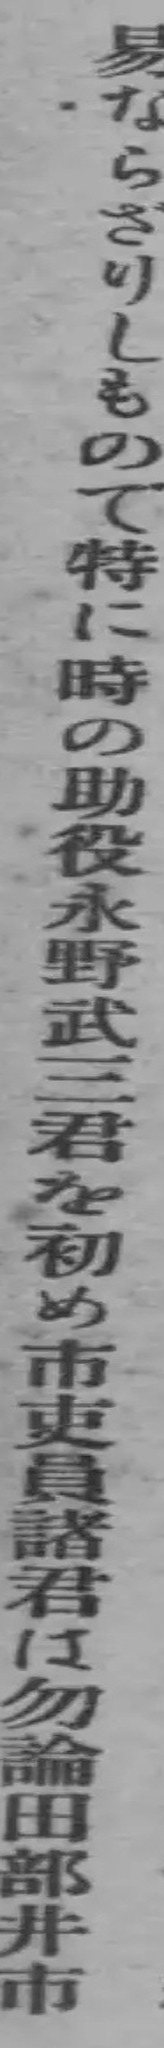易ならざりしもので特に時の助役永野武三君を初め市吏員諸君は勿論田部井市

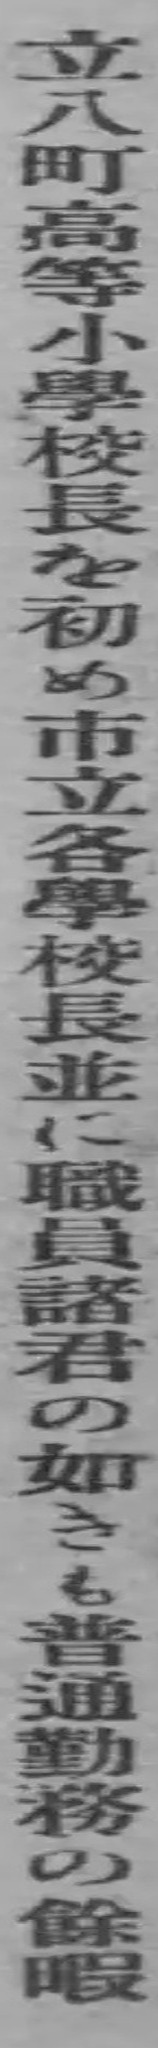立八町高等小学校長を初め市立各学校長並に職員諸君の如きも普通勤務の余暇
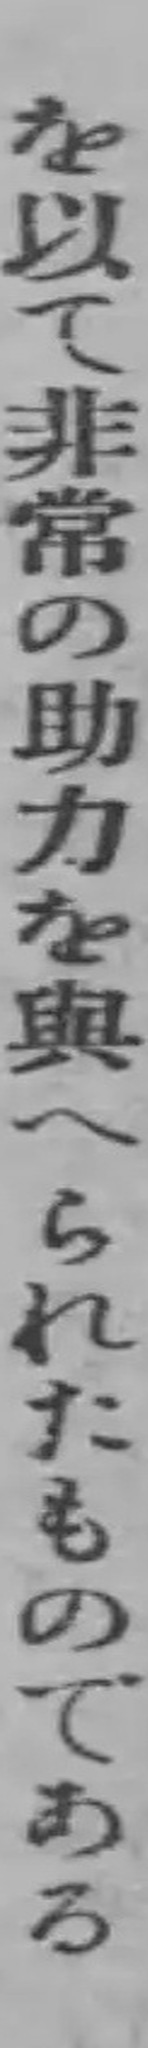を以て非常の助力を与へられたものである
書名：豊橋市史談
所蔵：国立国会図書館 National Diet Library, JAPAN
